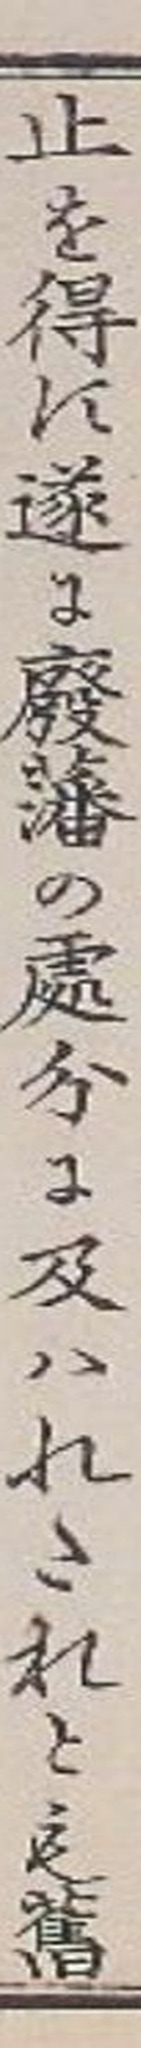止を得す遂に廃藩の処分に及はれたれとも旧
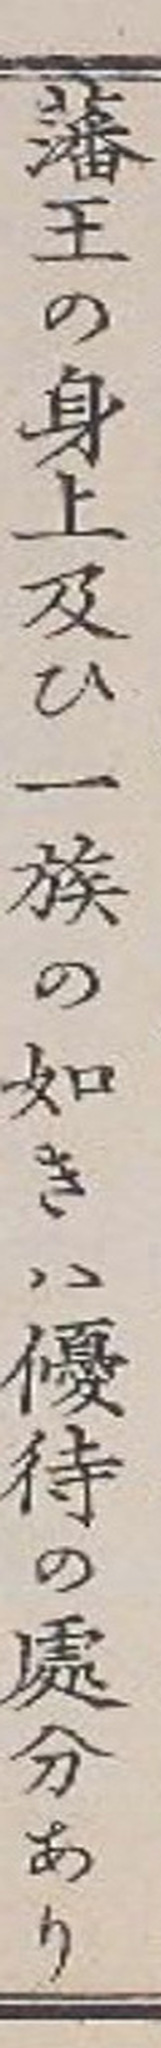藩王の身上及ひ一族の如きは優待の処分あり
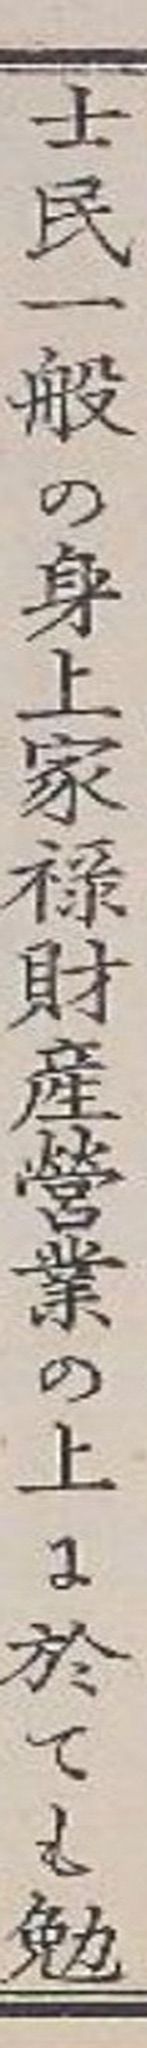士民一般の身上家禄財産営業の上に於ても勉
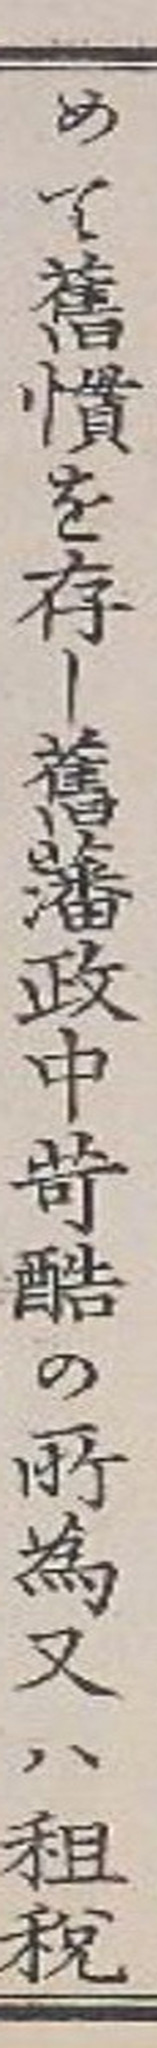めて旧慣を存し旧藩政中苛酷の所為又は租税
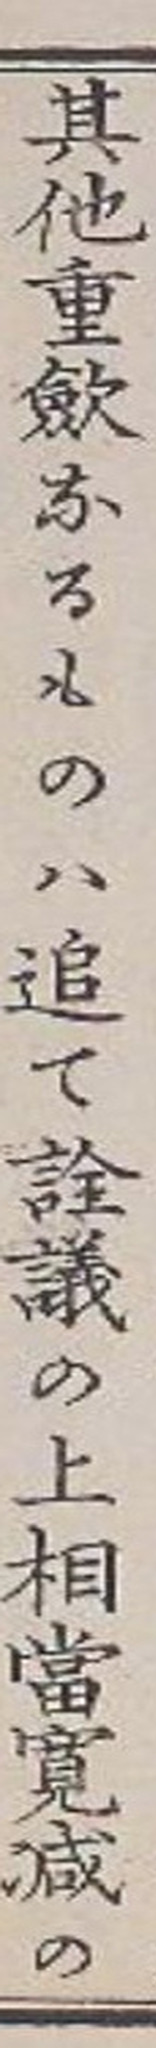其他重歛なるものは追て詮議の上相当寛減の
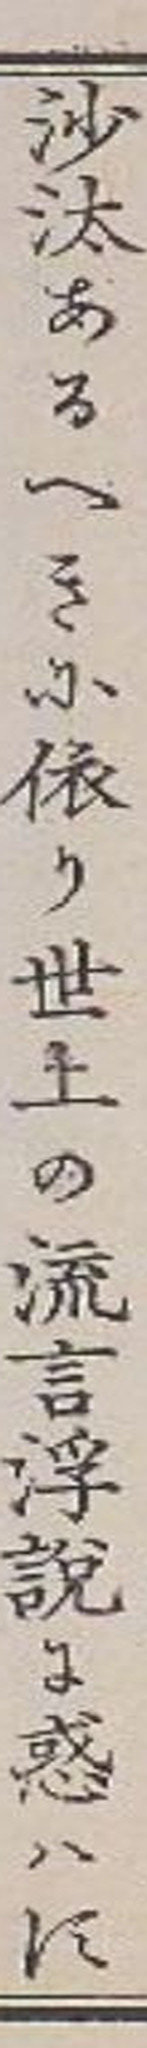沙汰あるへきに依り世上の流言浮説に惑わす
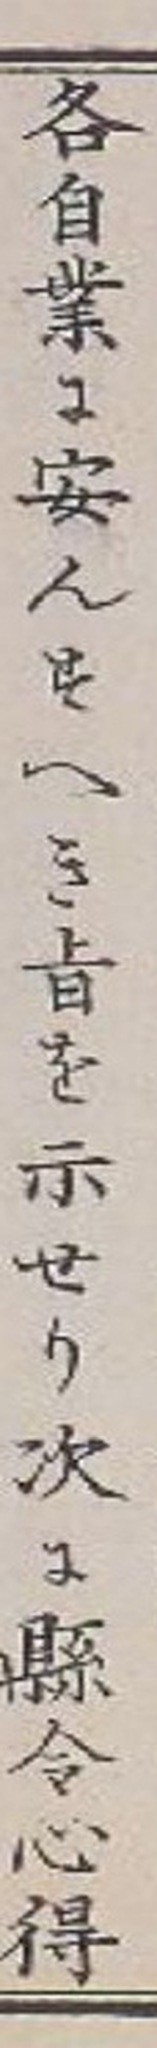各自業を安んすへき旨を示せり次に県令心得
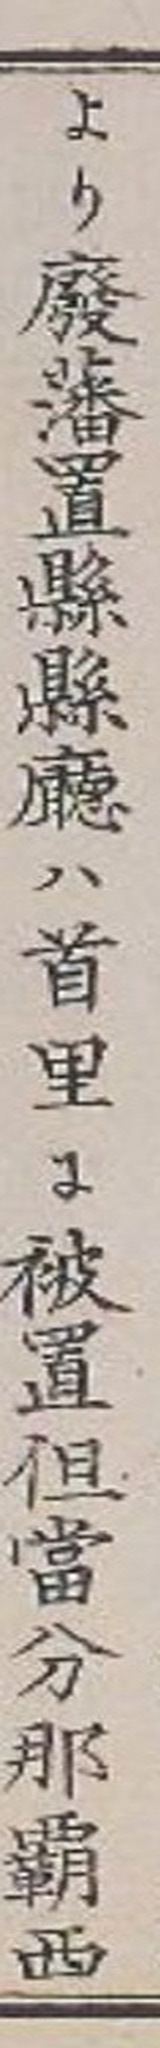より廃藩置県県庁は首里に被置但当分那覇西
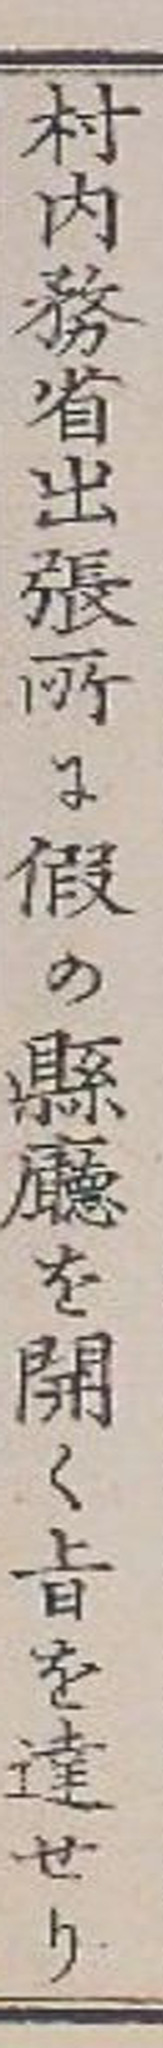村内務省出張所に仮の県庁を開く旨を達せり

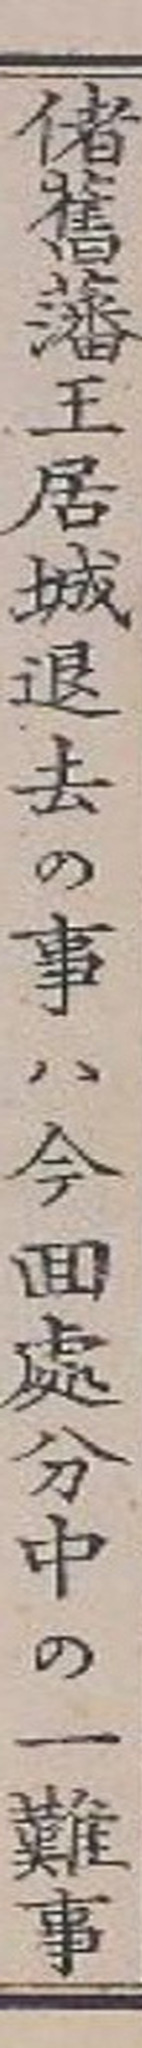偖旧藩王居城退去の事は今回処分中の一難事
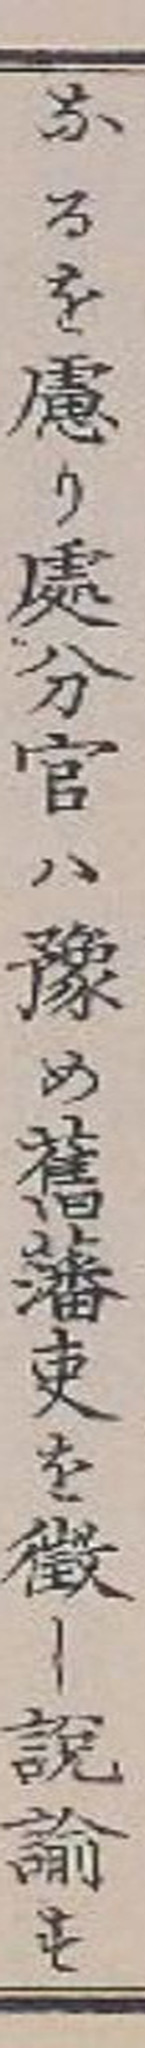なるを慮り処分官は予め旧藩吏を徴し説諭す
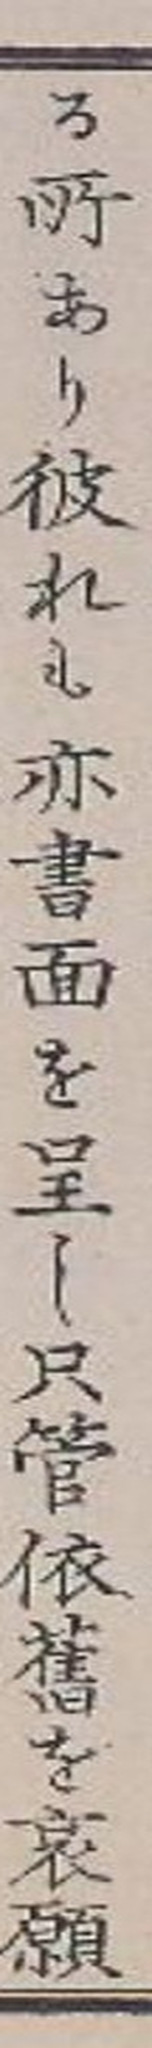る所あり彼れも亦書面を呈し只管依旧を哀願
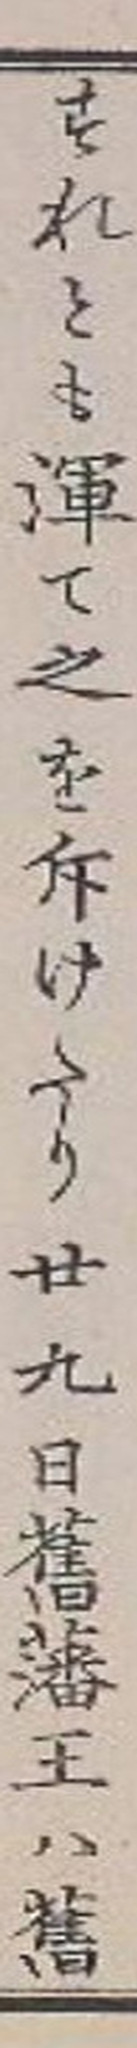すれとも渾て之を斥けたり廿九日旧藩王は旧
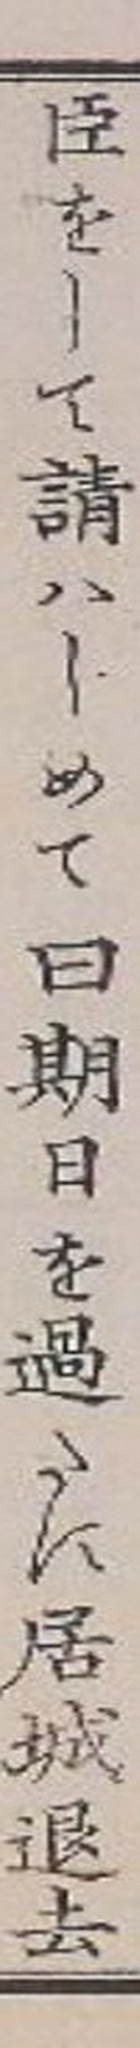臣をして請はしめて曰期日を過たす居城退去
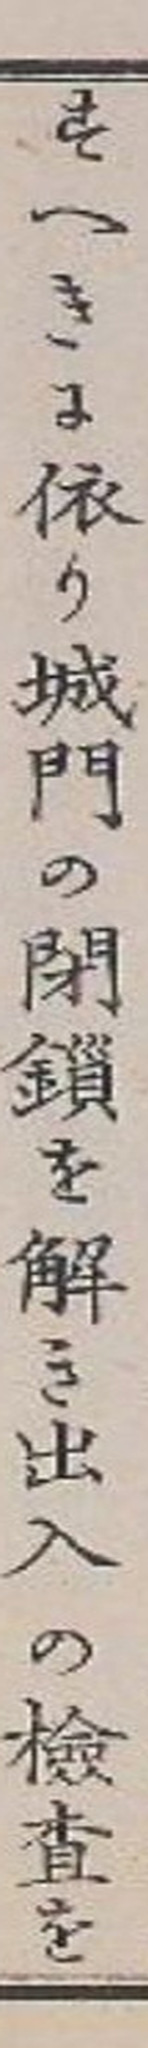すへきに依り城門の閉鎖を解き出入の検査を
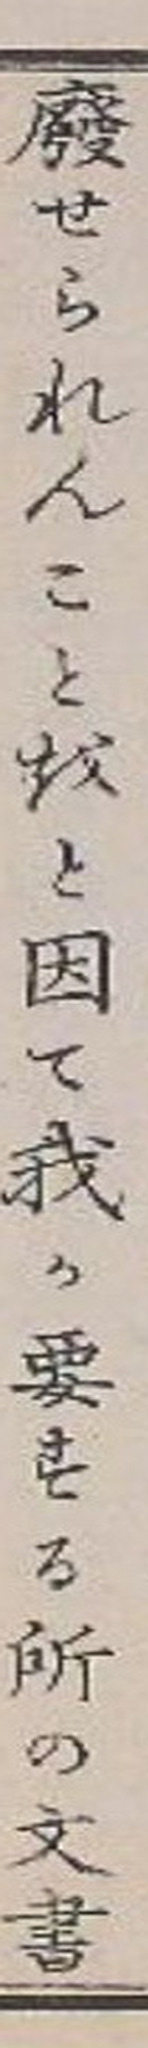廃せられんことをと因て我か要する所の文書
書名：南島紀事 下
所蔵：University of the Ryukyus Library
